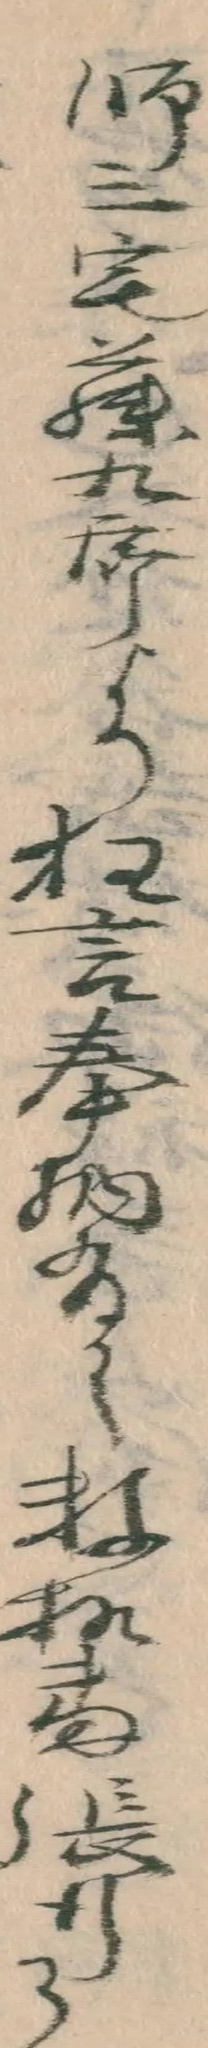師三宅藤九郎より狂言奉納有之数拾番張引了
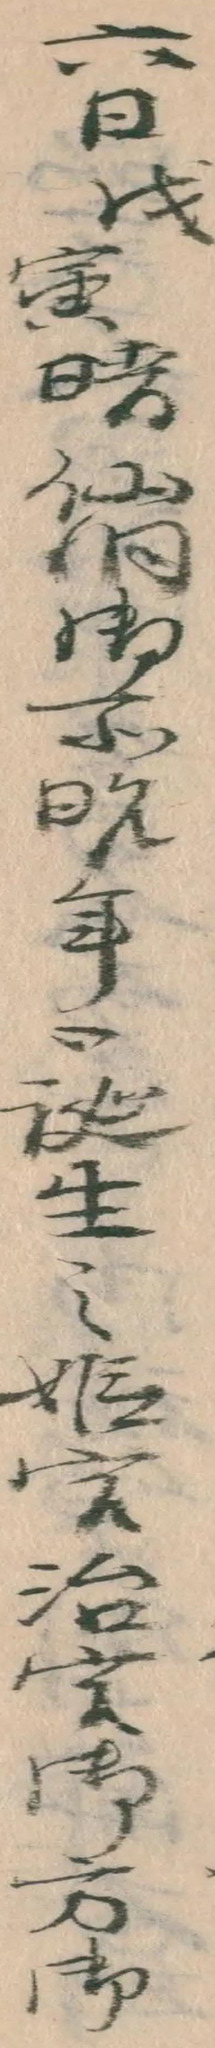六日戊寅晴仙洞御所昨年御誕生之姫宮治宮御方御
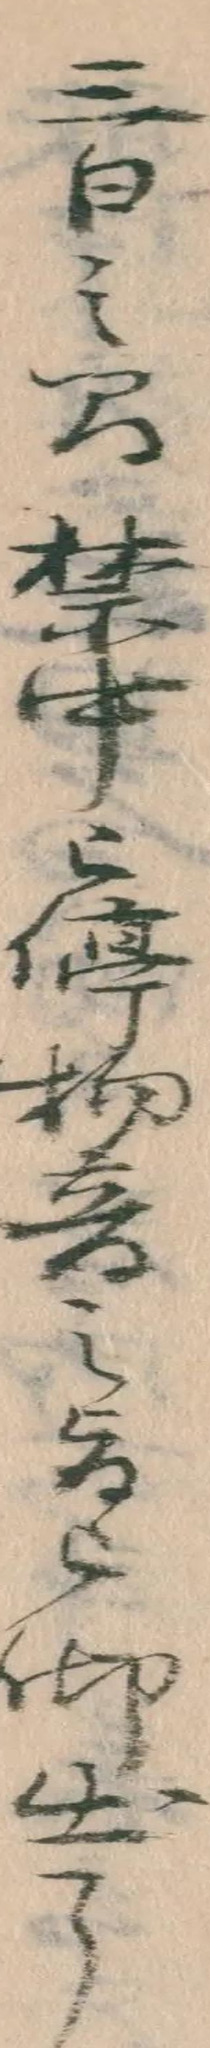三日之間禁中被停物音之旨被仰出了
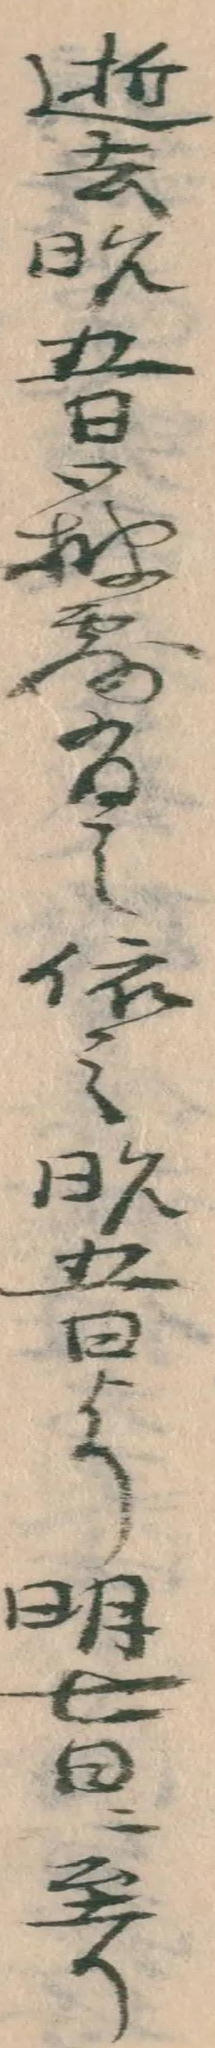逝去晩五日御披露有之依之昨五日より明七日ニ至り
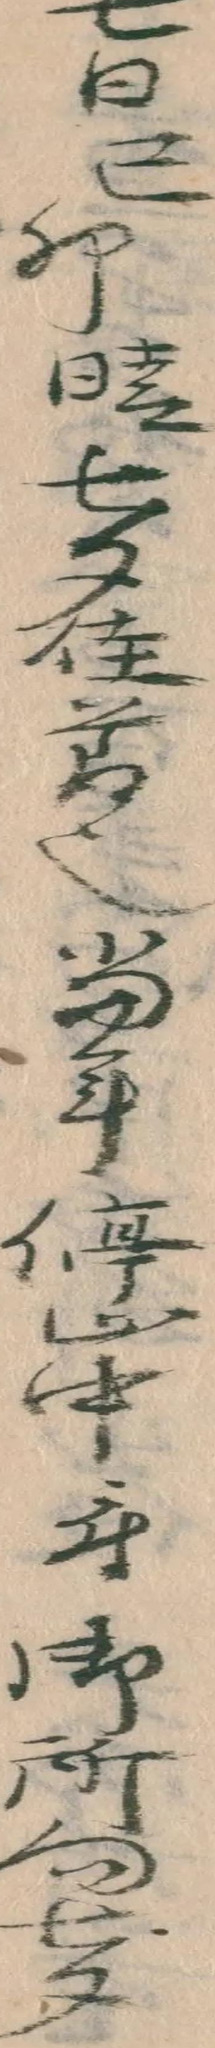七日己卯晴七夕佳節也當年停止中ニ付御所向七夕
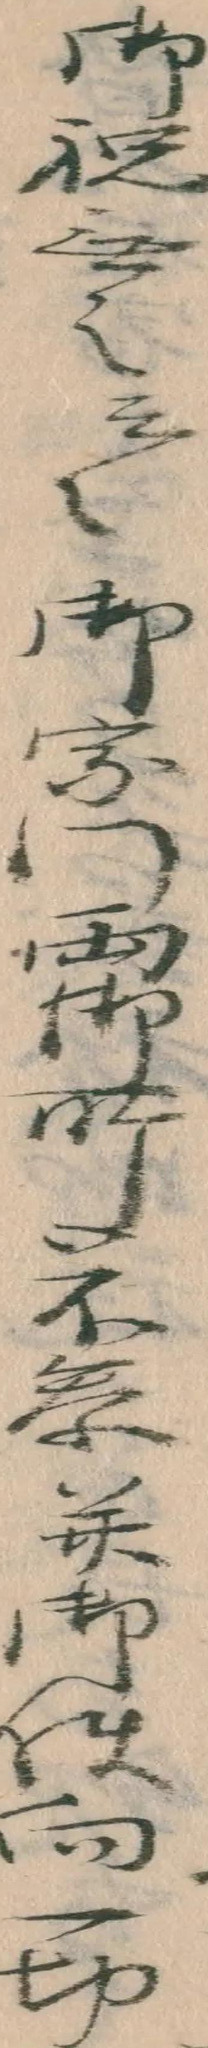御祝無之云々御家門両御所御不参并御使向一切
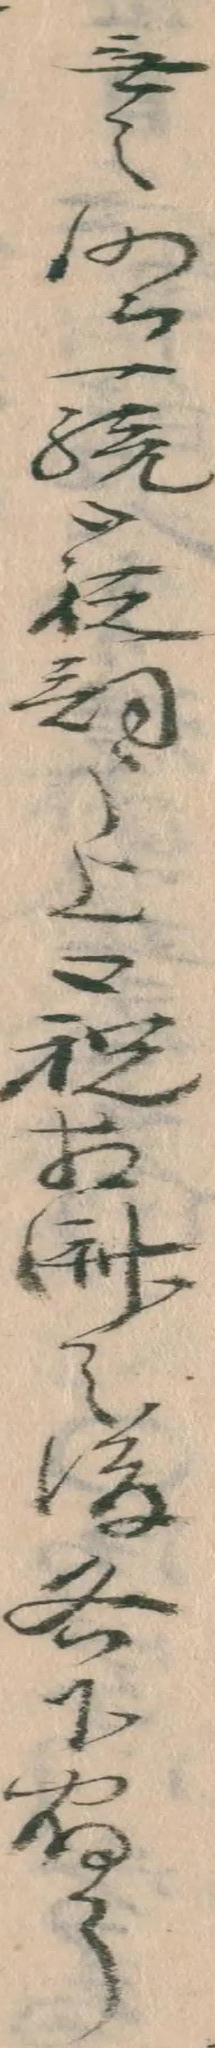無之仍而一統御祝詞申上御祝相済之後各下宿了
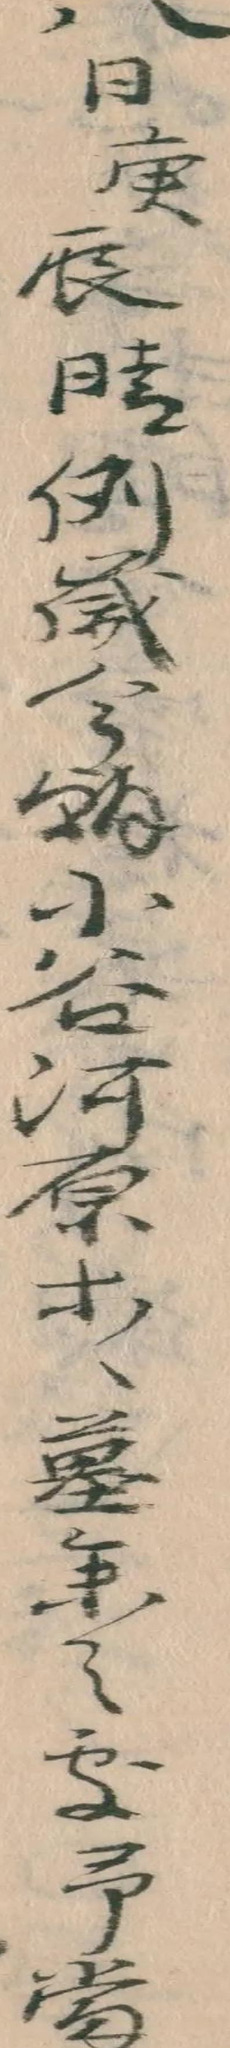八日庚辰晴例歳今朝小谷河原等ヘ墓参之處予當
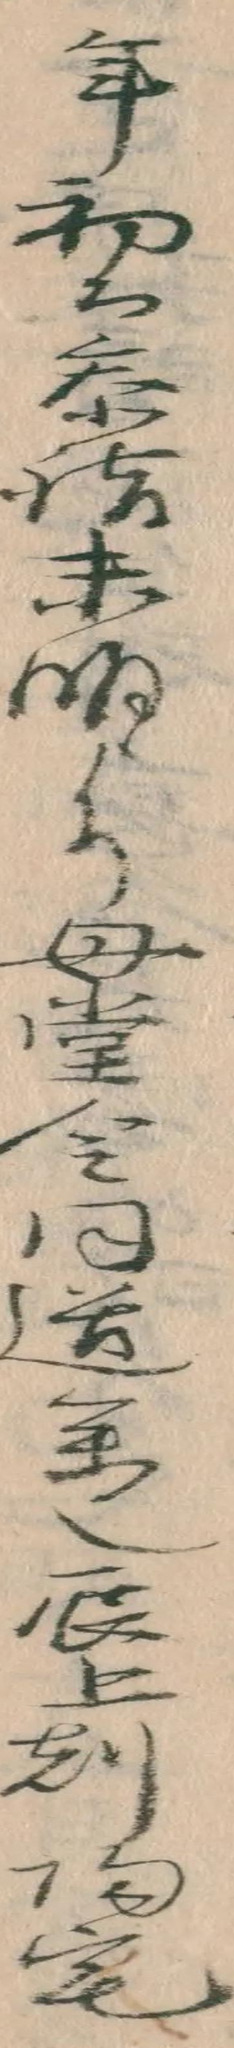年初而参詣未明より母堂令同道参也辰上刻帰宅
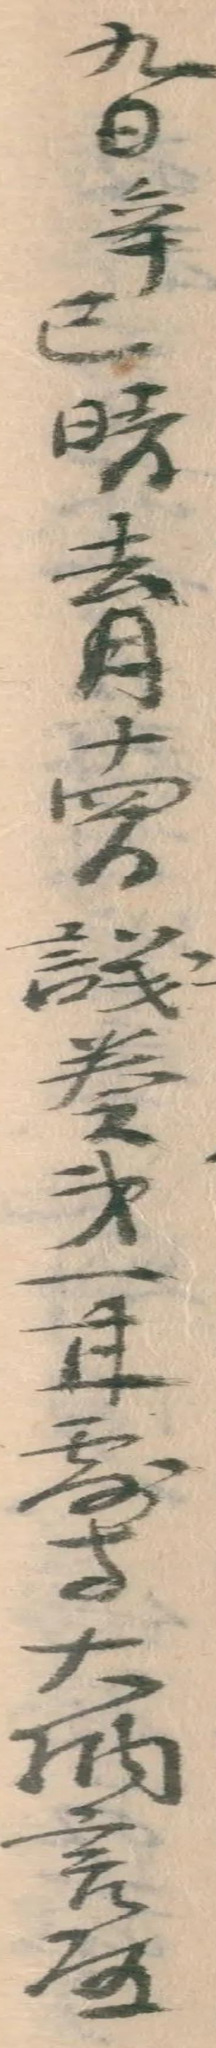九日辛巳晴去月十四日議奏第一甘露寺大納言殿
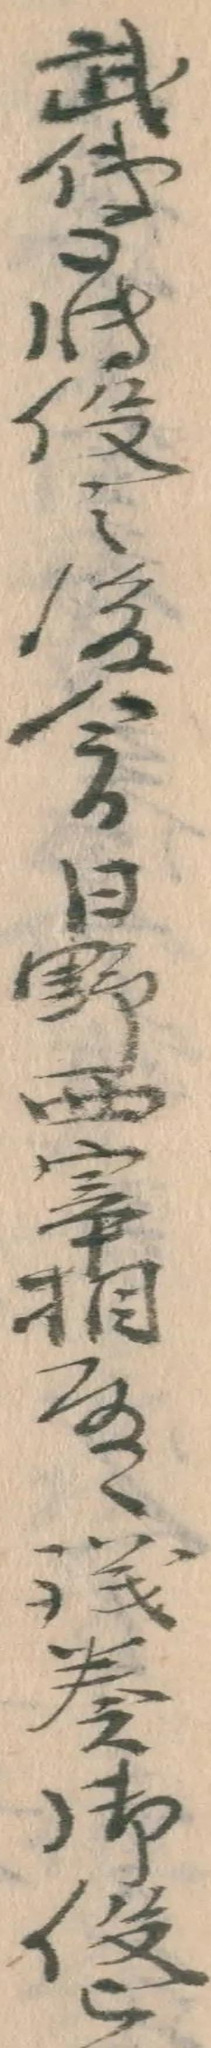武傳御轉役之後今日日野西宰相殿へ議奏御役被
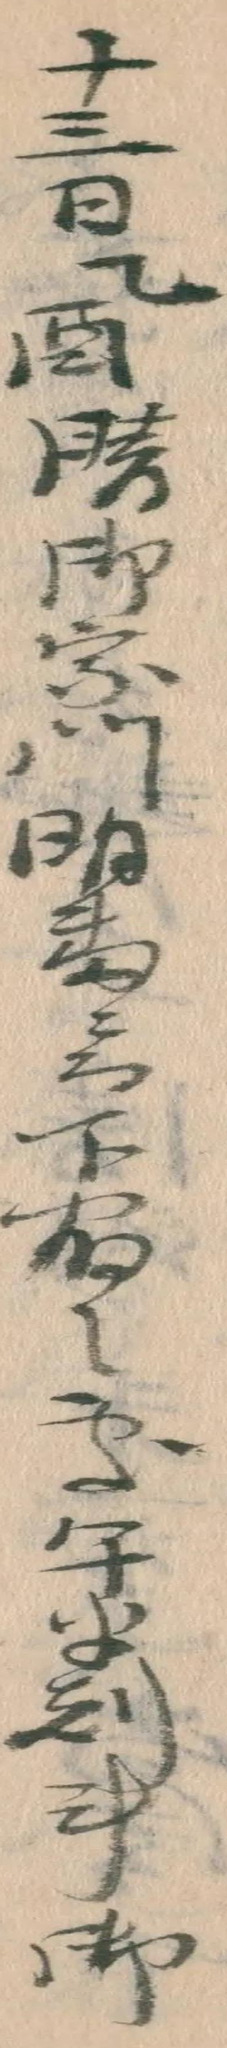十三日乙酉晴御家門明番ニ而下宿之處午半刻斗御
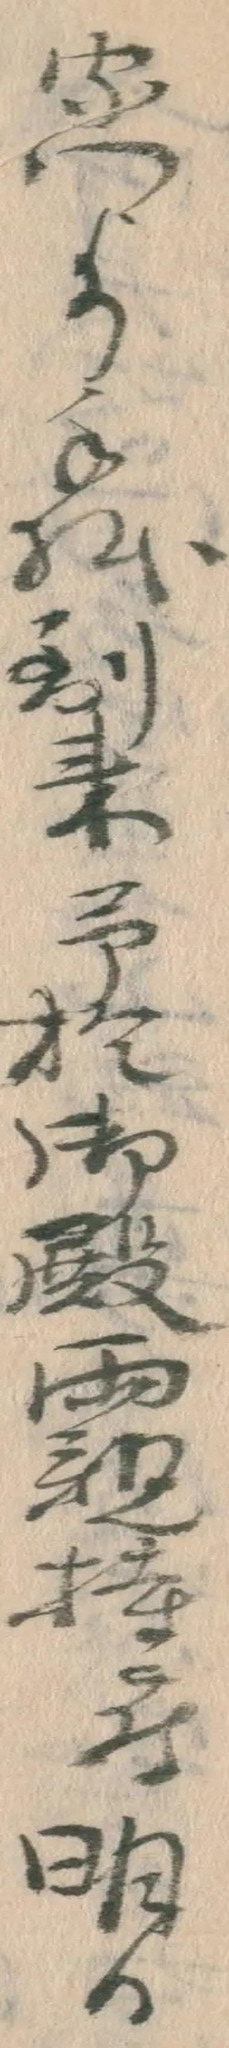家門より手伝到来予於御殿両親持二付明日
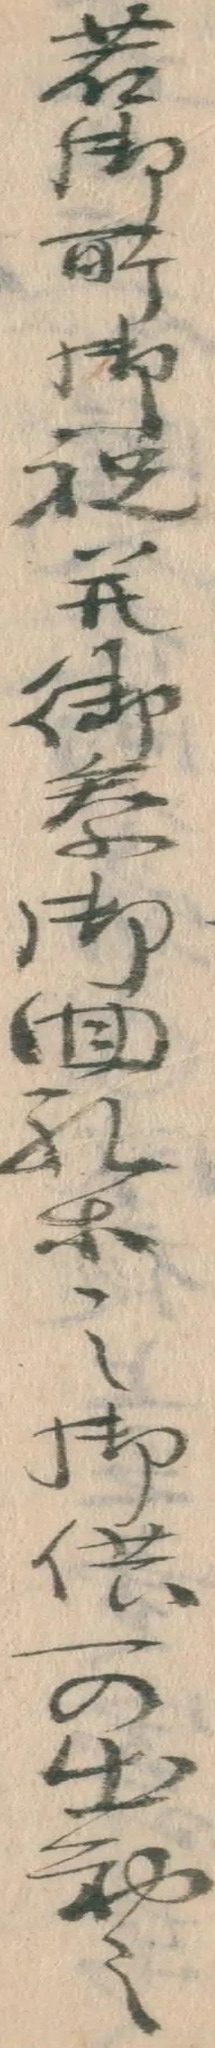若御所御祝并御参御回礼等之御供可出勤之
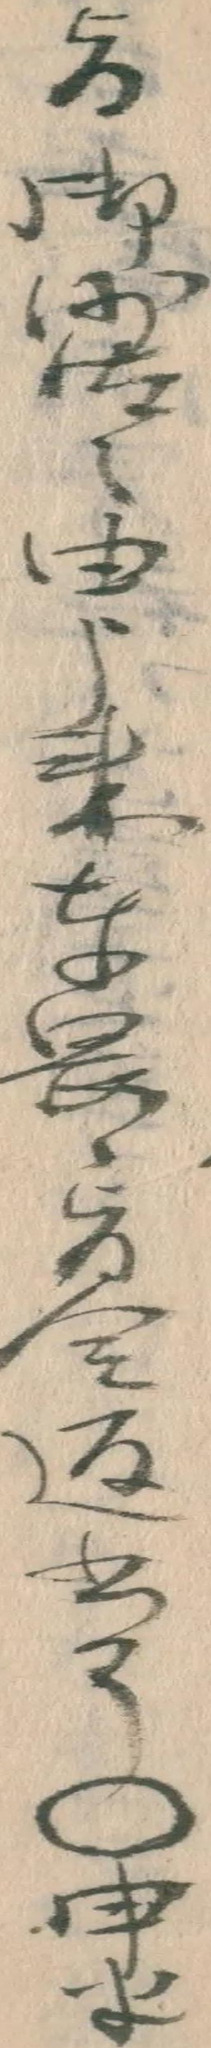旨御沙汰之由申来奉畏候旨令返書了○申半
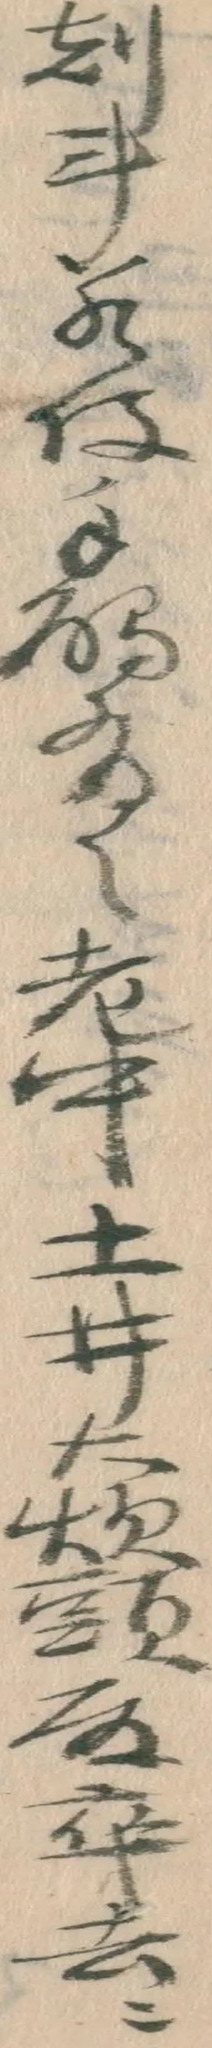刻斗若役手触有之老中土井大炊頭取卒去ニ
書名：賀茂社記録. 第63冊
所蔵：国立国会図書館 National Diet Library, JAPAN
